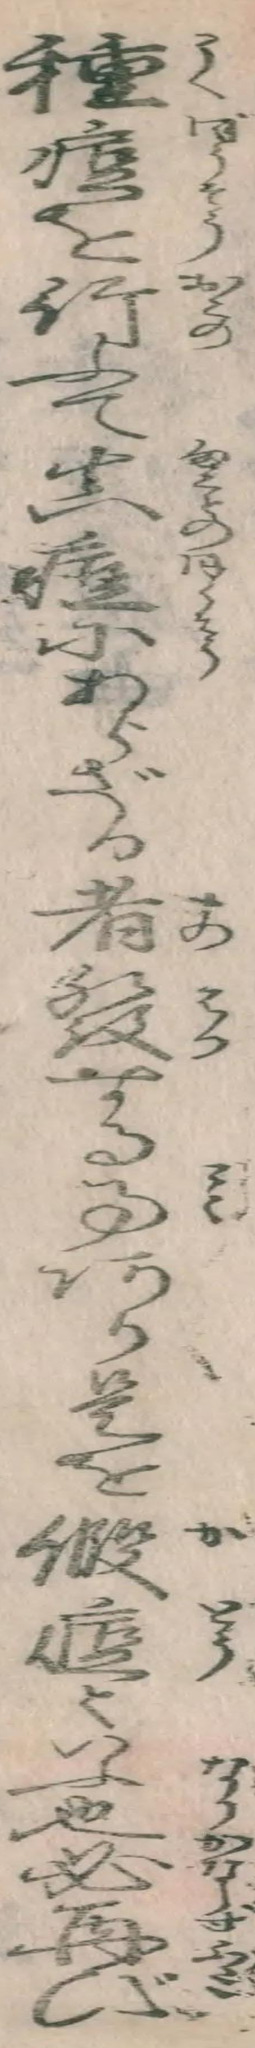種痘を行ふて真痘にあらざる者発する事あり是を仮痘といふ也必再び
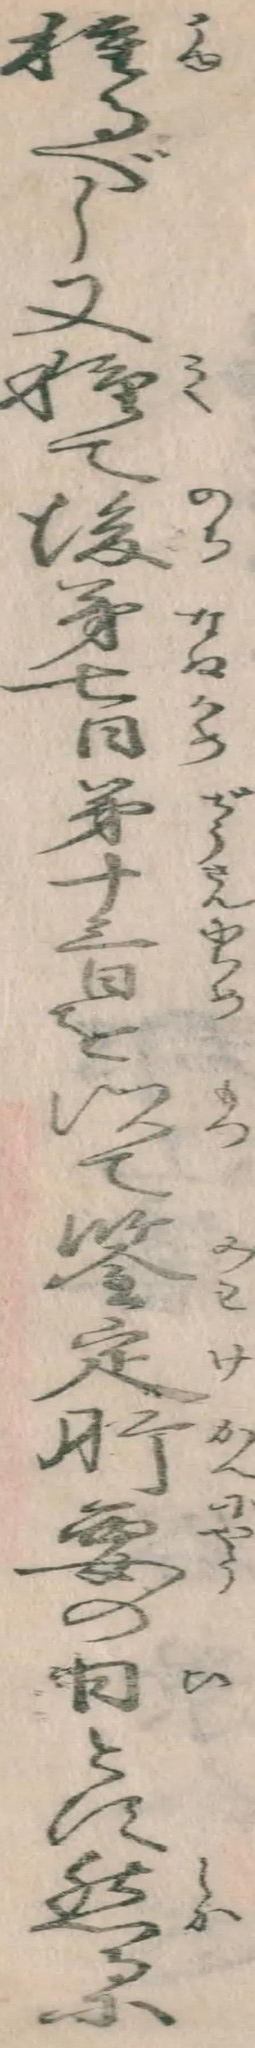種るべし又種て後第七日第十三日を以て定肝要の日とす然るに
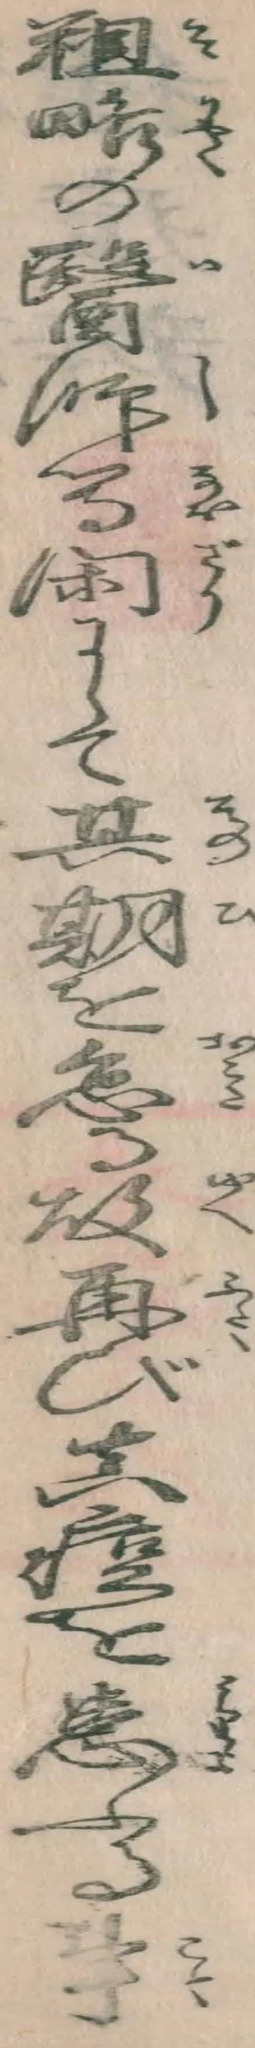粗略の医師等閑にして其期を怠る故再び真痘を患ふる事
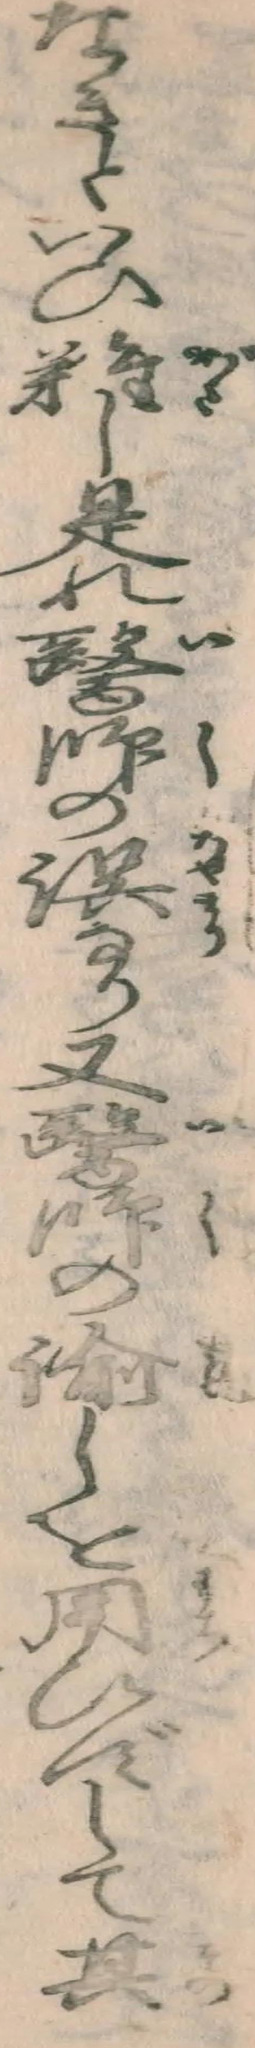なきといひ難し是医師の誤なり又医師の諭しを用ひずして其
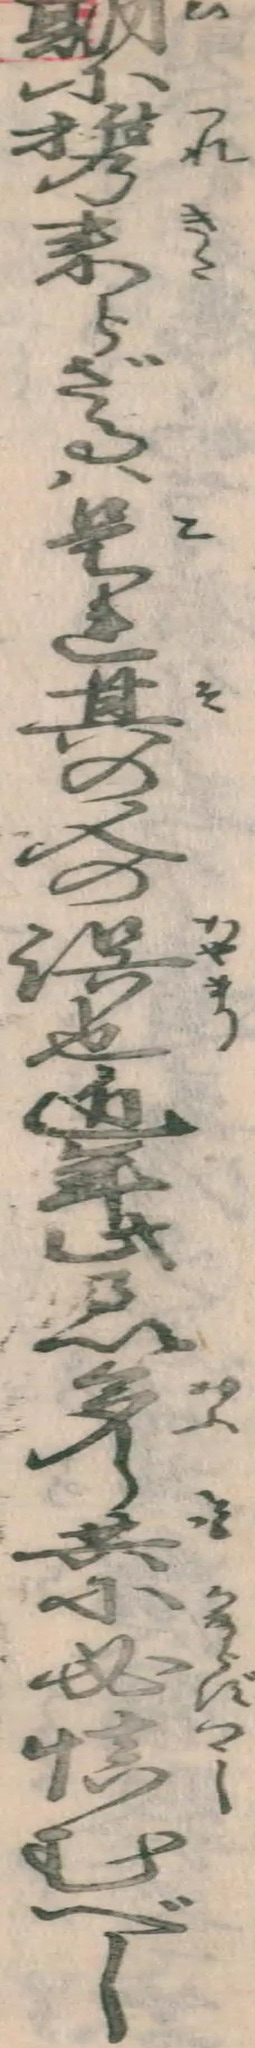期に携来らざるは是れ其の人の誤也近年此事以多し共に必慎むべし
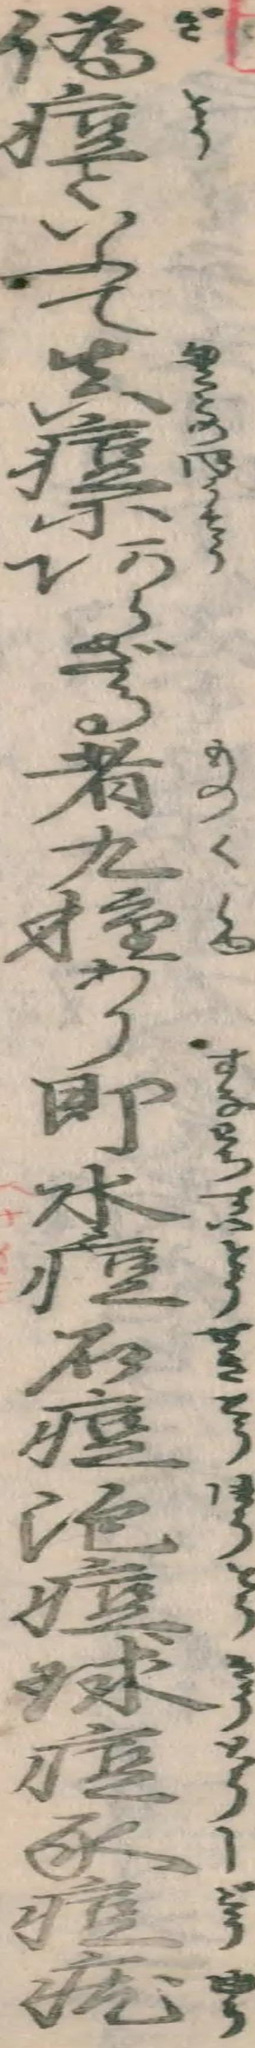偽痘といふて真痘にあらざる者九種あり即水痘石痘泡痘球痘永痘疣
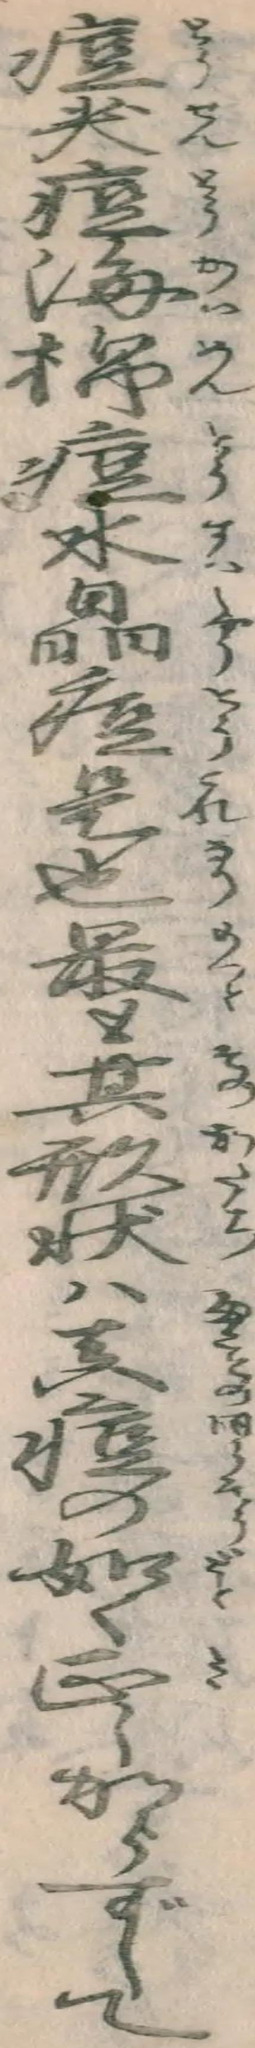痘天痘海綿痘水晶痘是也最も其形状は真痘の如く正しからずして
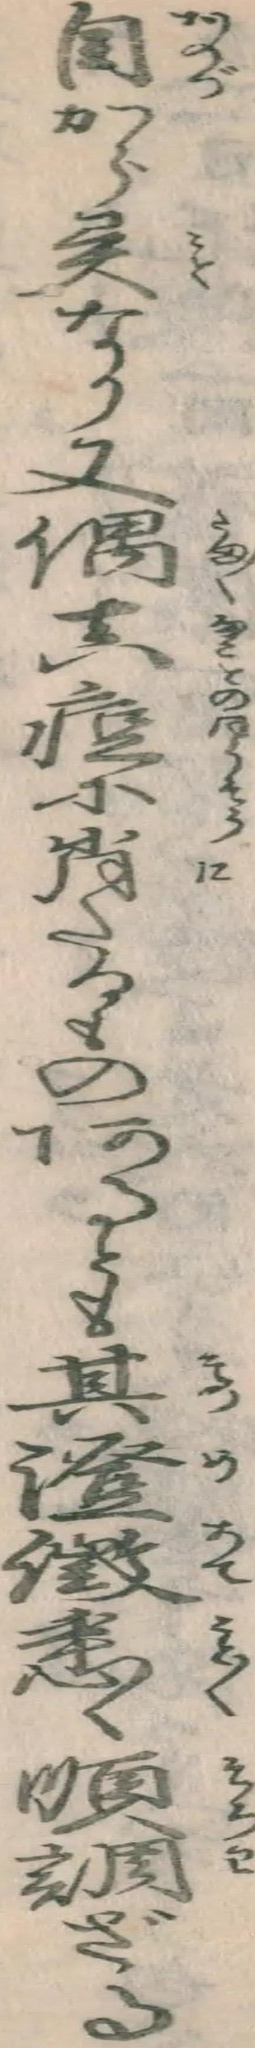自から異なり又偶真痘に肖たるものあるとも其証徴悉く順調ざる
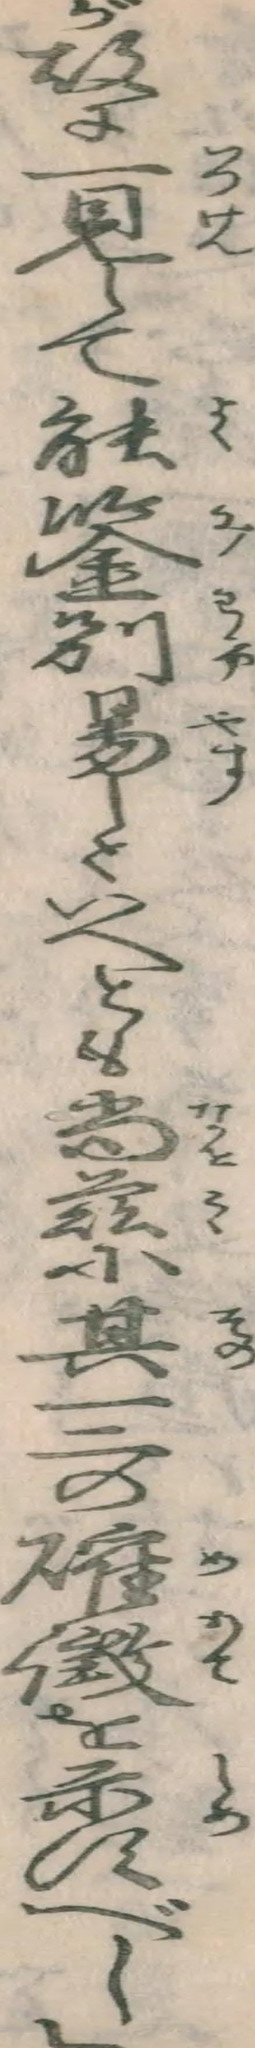が故に一見して能別易しといへとも尚茲に其一二の確徴を示すべしこと
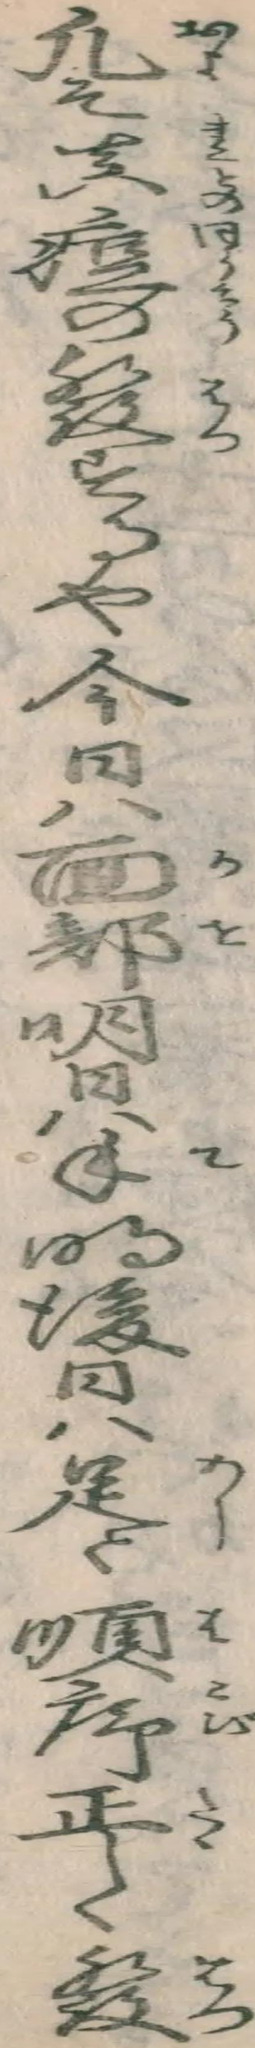凡そ真痘の発するや今日は面部明日は手明後日は足と順序正しく発
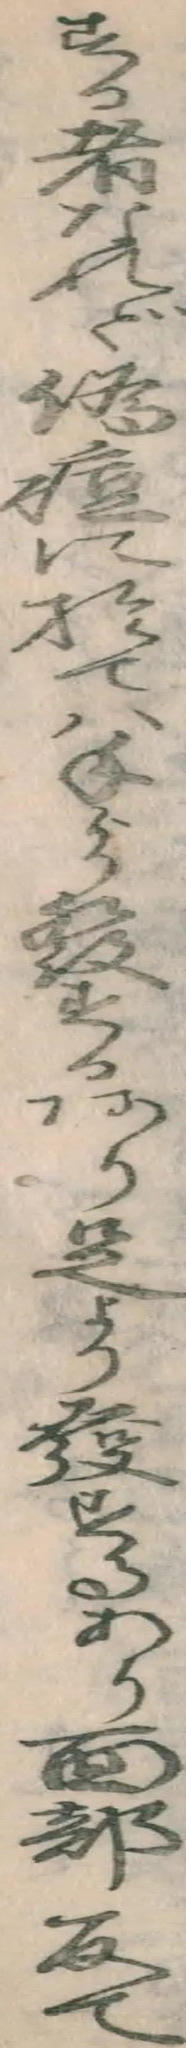する者なれど偽痘に於いて手より発するあり足より発するあり面部反て
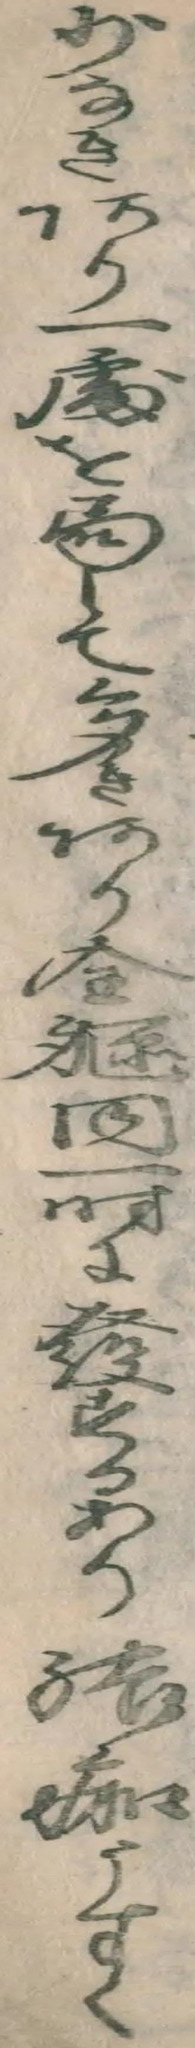少なきあり一処を局して多きあり全軀同一時に発するあり結痂うすく

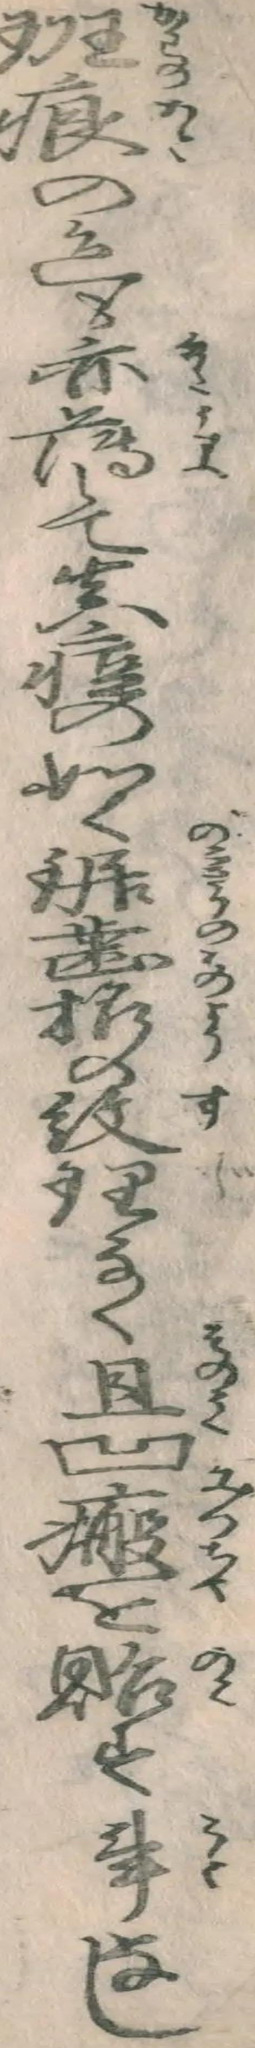斑痕の色も亦薄して真痘の如く鋸歯様の紋理なく且凹瘢を貽す事なし
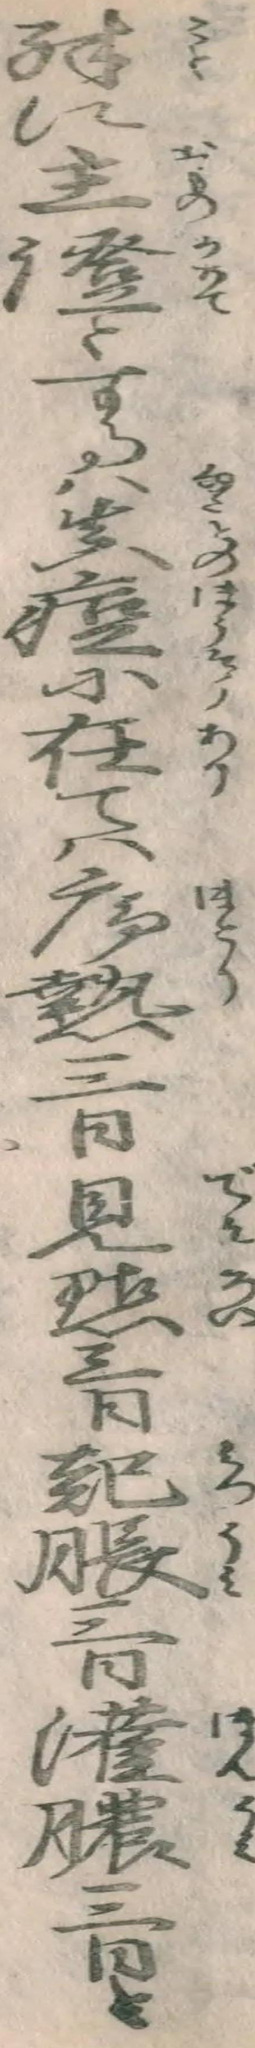殊に主証とするは真痘に在ては病熱三日見熱三日起膿三日濃膿三日と
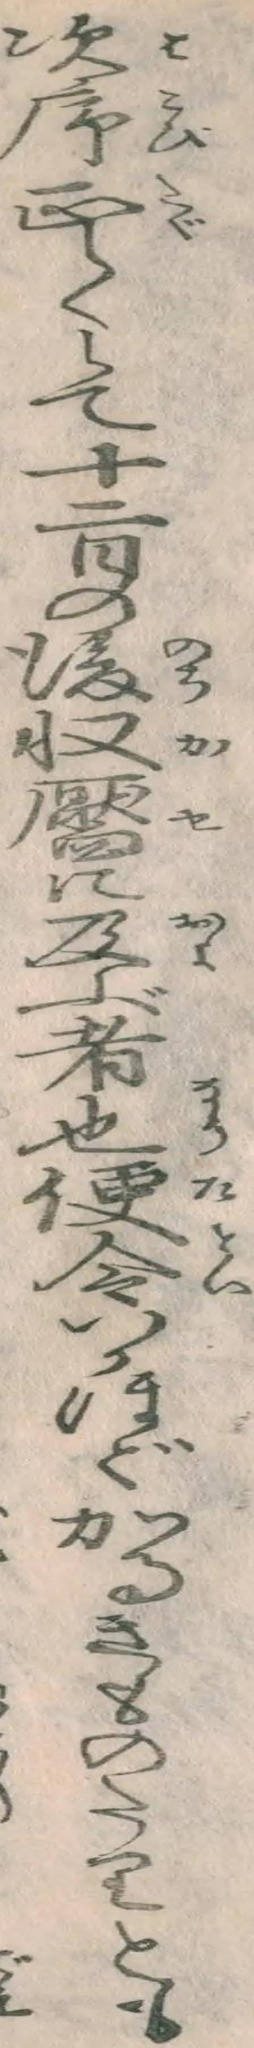次序正しくして十二日の後収靨に及ぶ者也便令いかほどかるきものたりとも
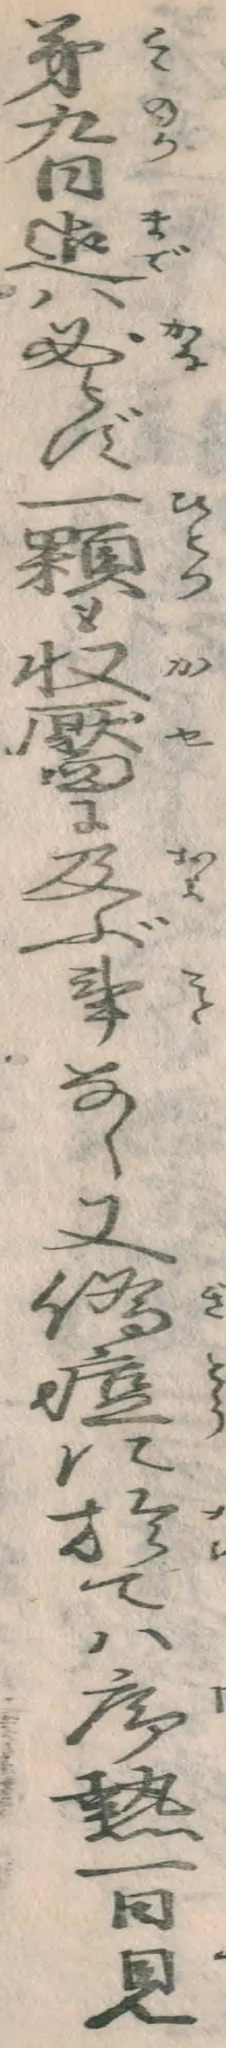第九日迄は必らず一顆も収靨に及ぶ事なし又偽痘に於ては序熱一日見
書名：種痘辨
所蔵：国立国会図書館 National Diet Library, JAPAN
